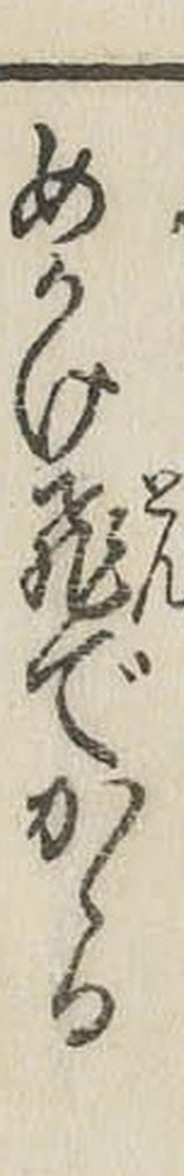めかけ飛でかゝる
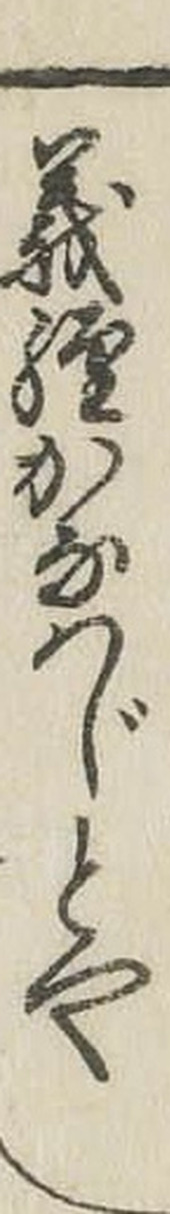義経かなはじとや
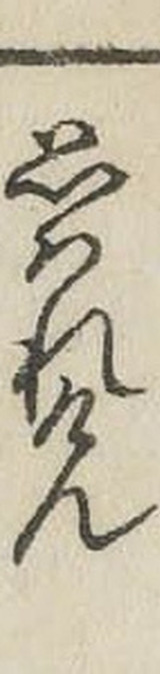思はれけん
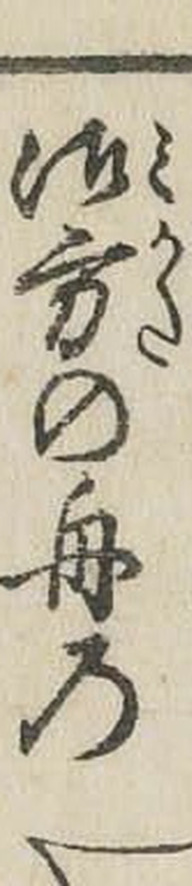御方の舟の
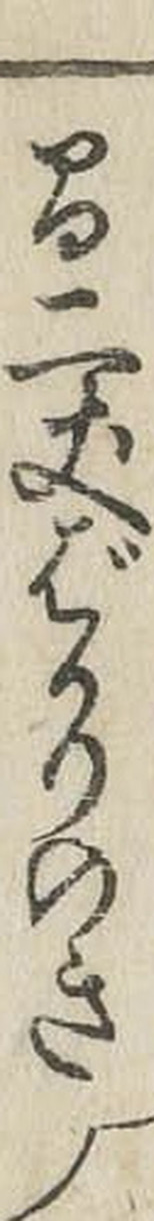間二丈ばかりのき
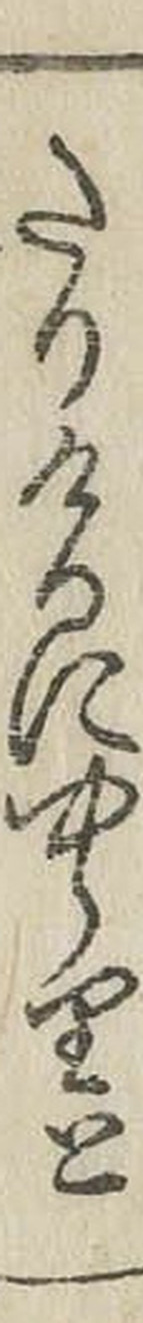たりけるにゆらりと
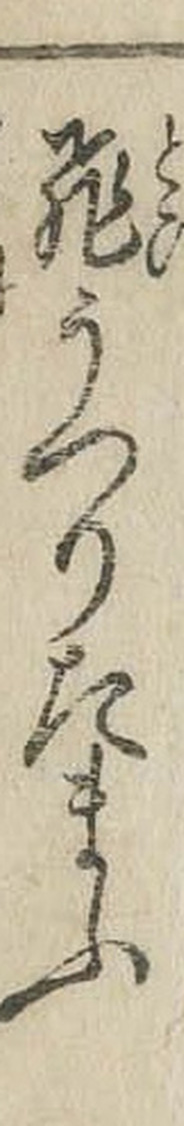飛うつりたまふ
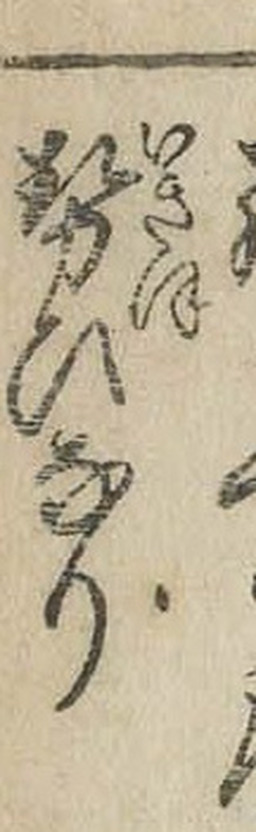勢ひなり

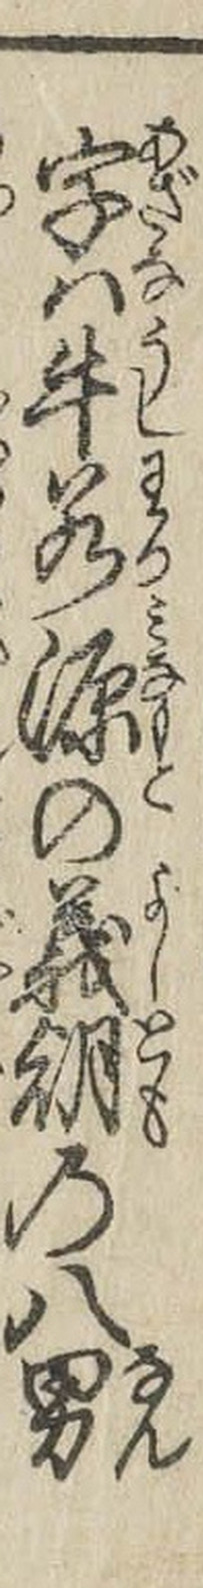字は牛若源の義朝の八男
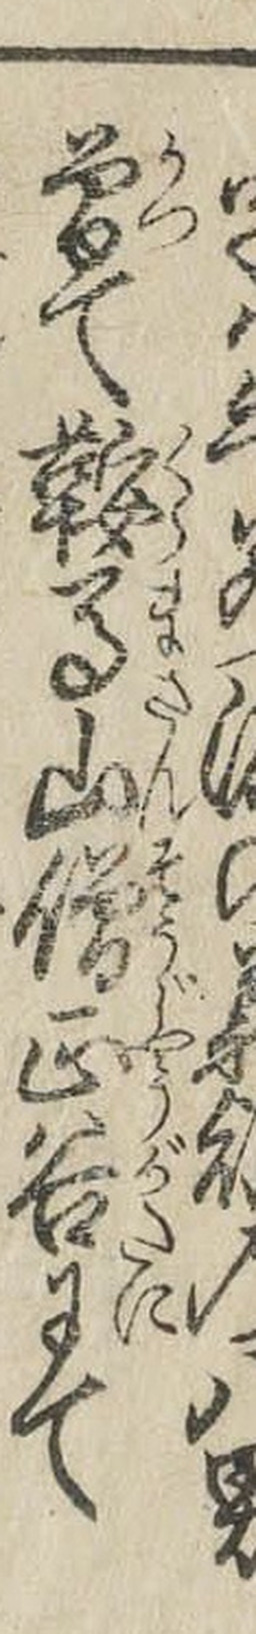曽て鞍馬山僧正谷にて
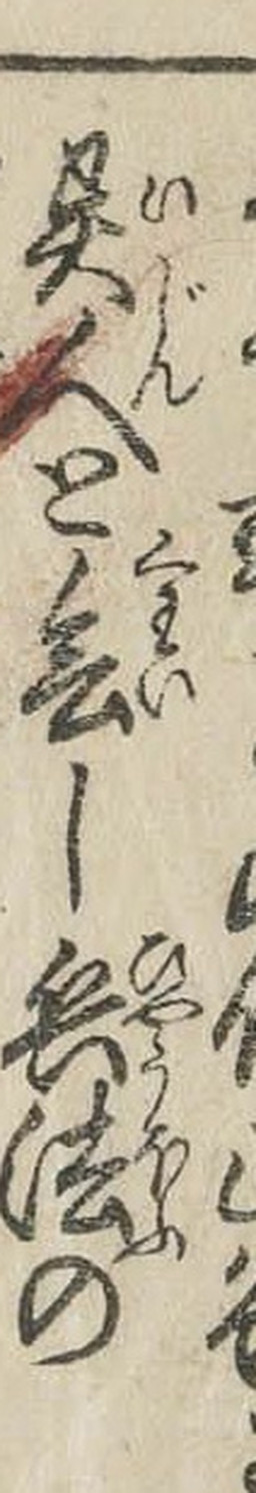異人と会し兵法の
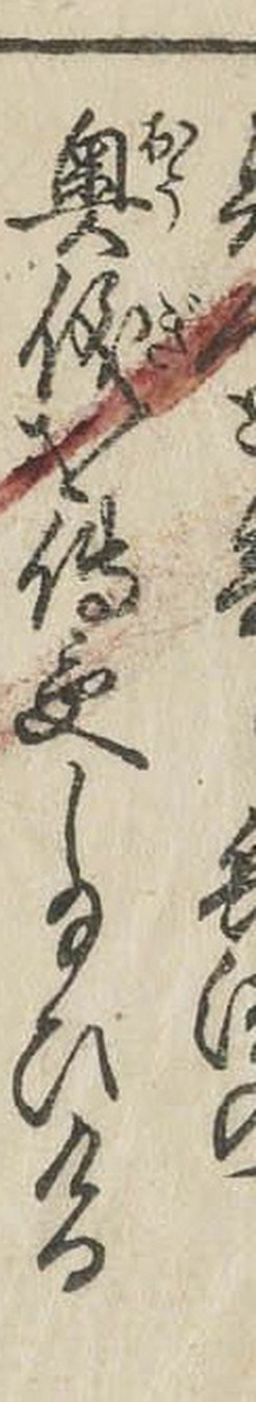奥儀を伝受し給ひける
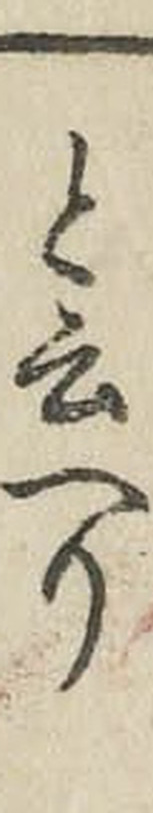と云へり
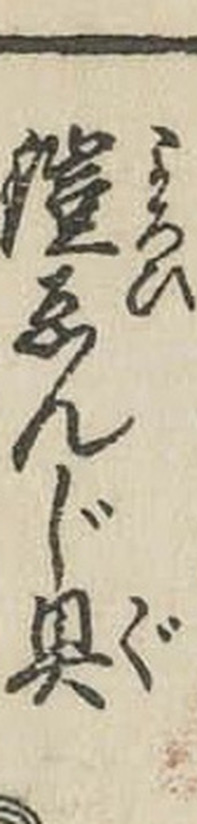鎧ゑんじ具
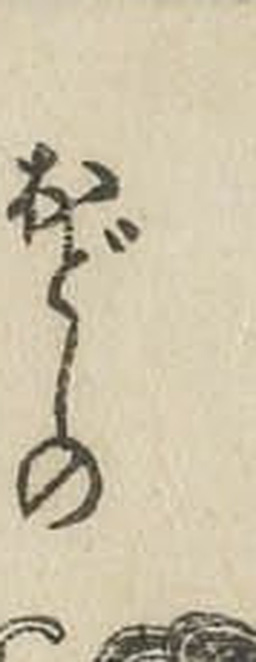おどしの
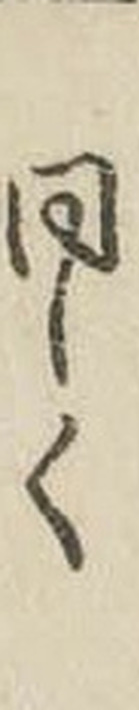同しく
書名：絵本写宝袋 9巻 3之巻
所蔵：東京学芸大学教育コンテンツアーカイブ
